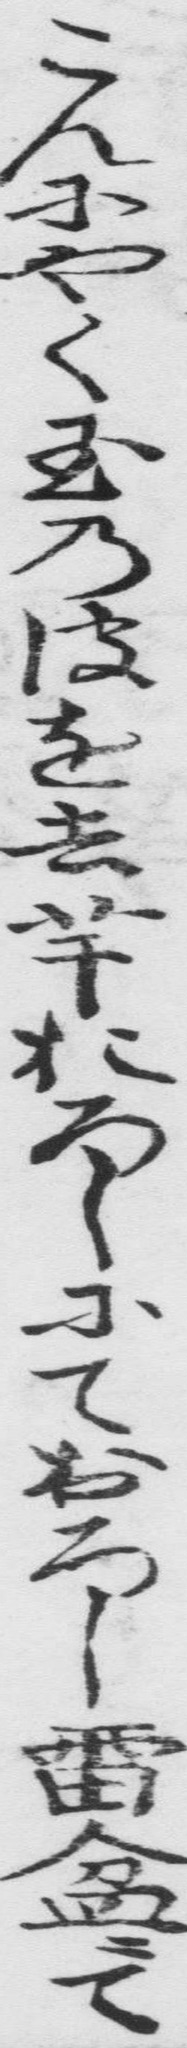こん尓やく玉乃皮を去芋於ろし尓ておろし雷盆にて
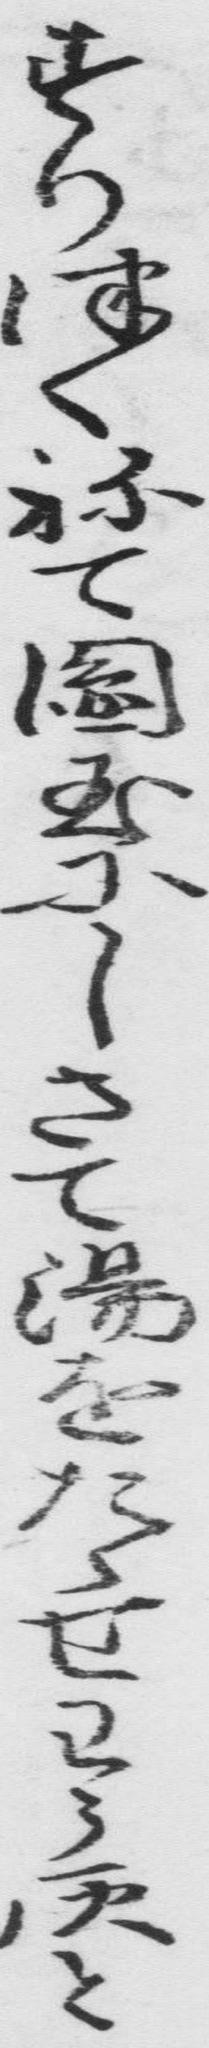春り津く祢て団玉尓しさて湯をたゝせわら灰と
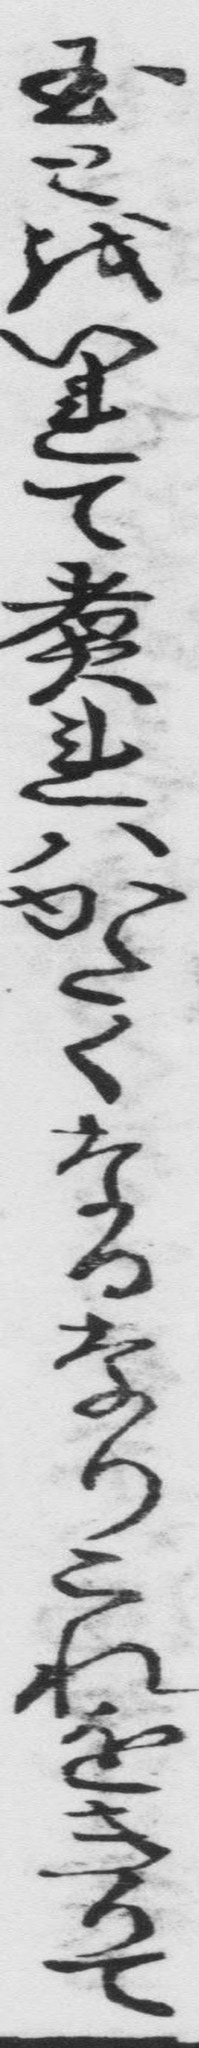玉と越い連て煮蓮はかたくなるなりこれをきりて
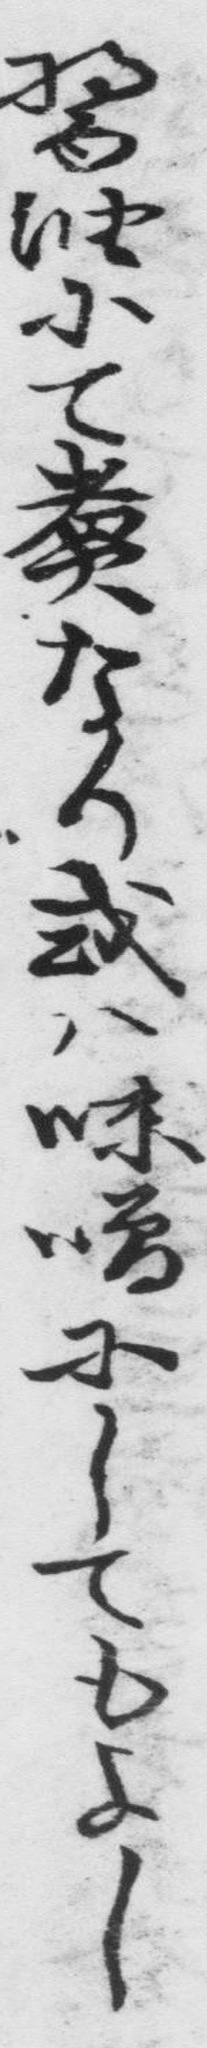醤油尓て煮なり或は味噌尓してもよし
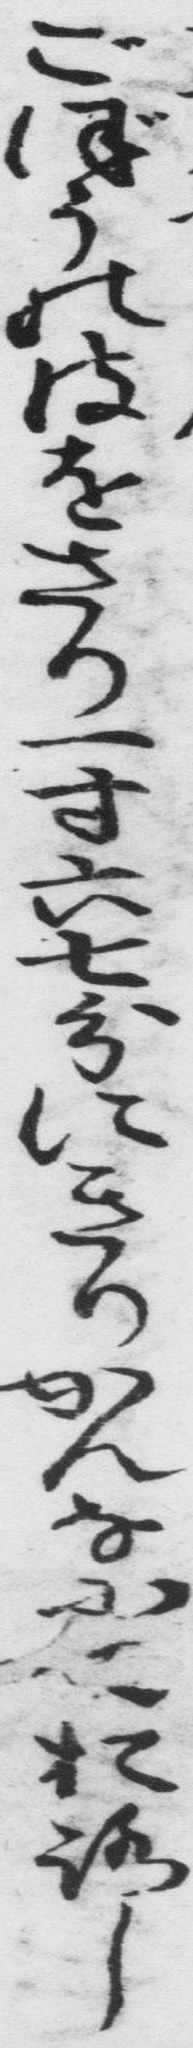ごぼう能皮をさり一寸六七分にきりかんな尓て於路し
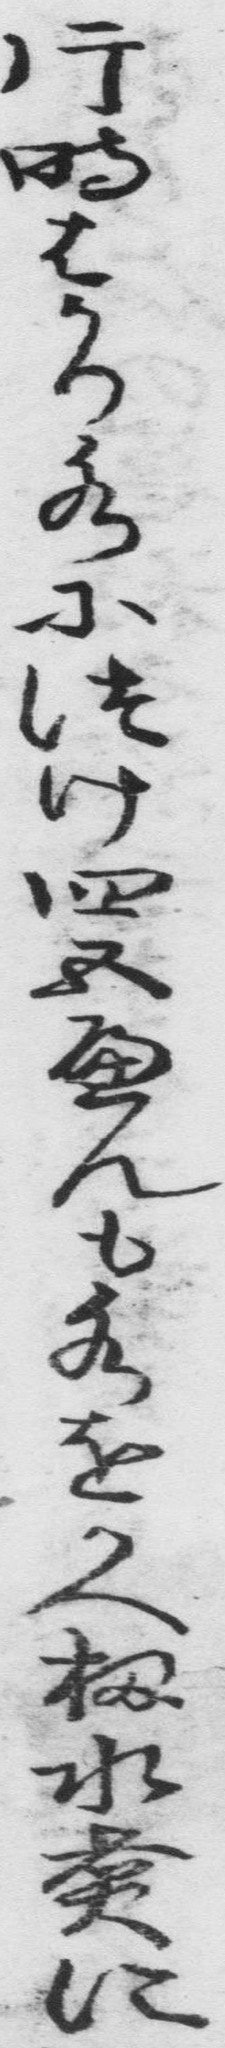片時はかり水尓徒け四五扁んも水をかへ扨水煮に
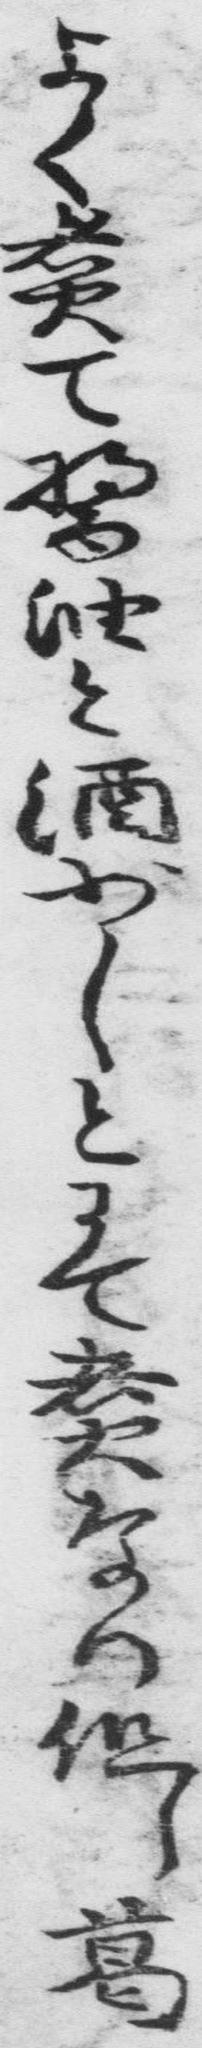よく煮て醤油と酒少しと尓て煮なり但し葛
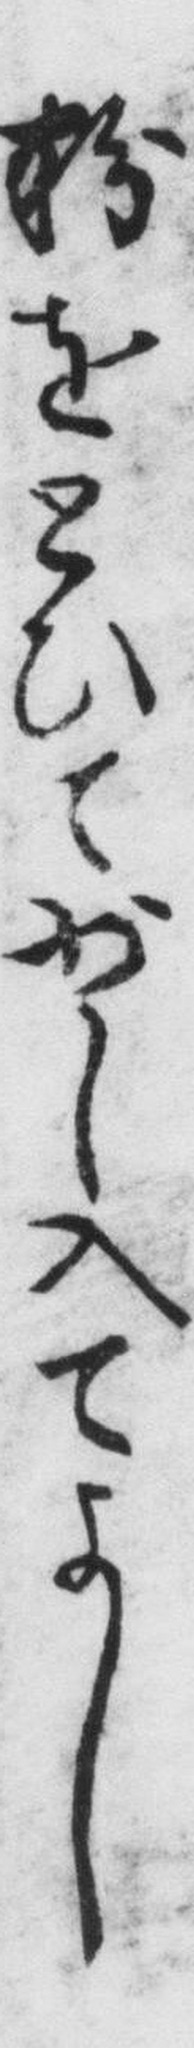粉をとひて少し入てよし

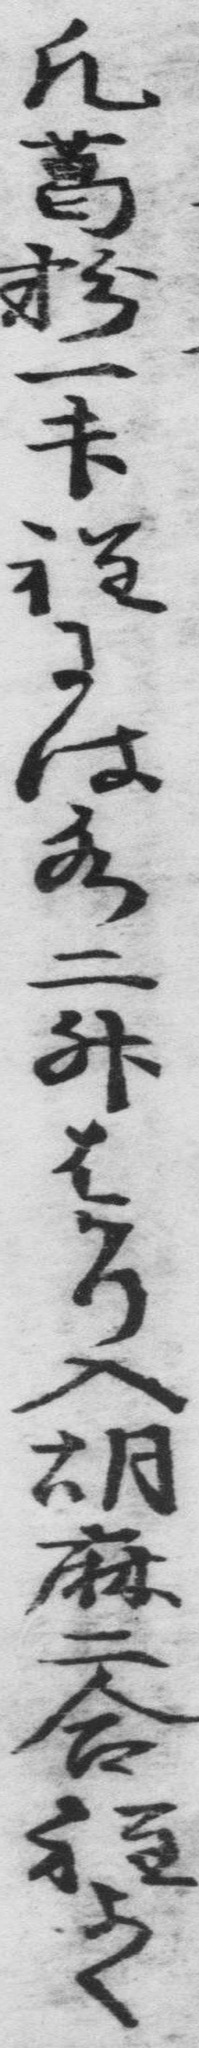凡葛粉一升程には水二升はかり入胡麻二合程よく
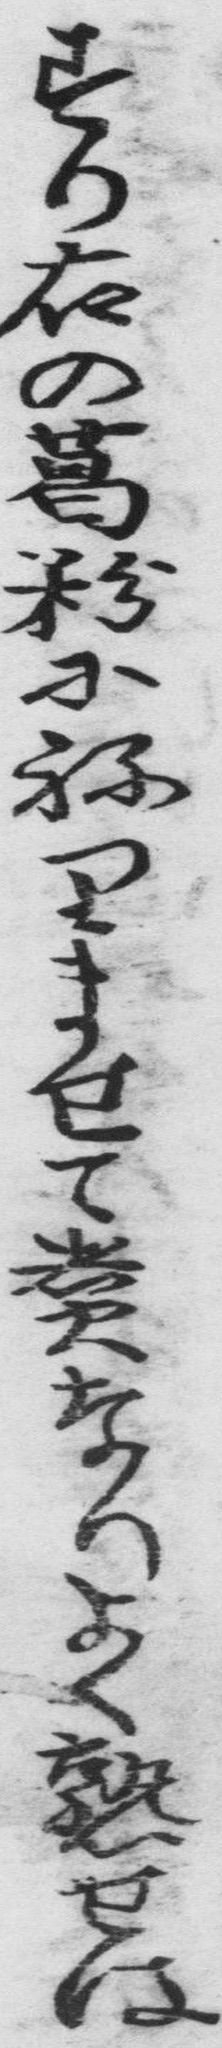春り右の葛粉尓祢里ませて煮なりよく熟せは
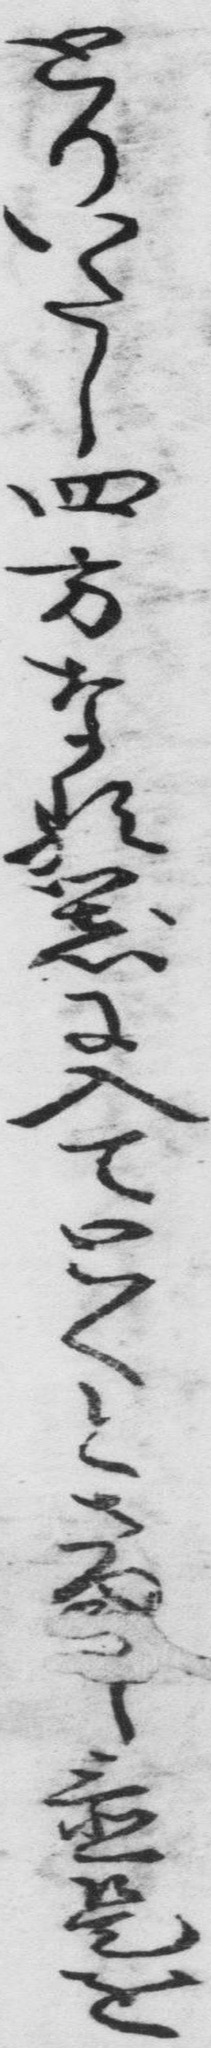とりいたし四方な類器尓入てとくとさまし置是を
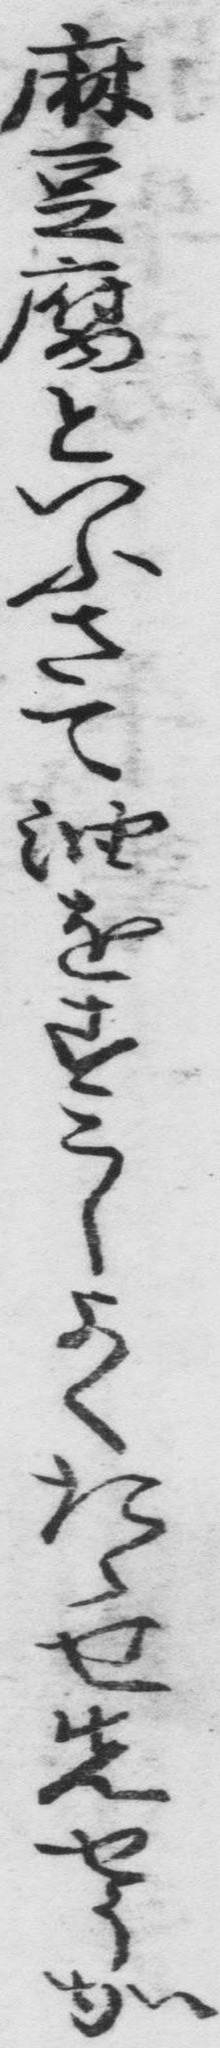麻豆腐といふさて油を春こしよくたゝせ先せうが
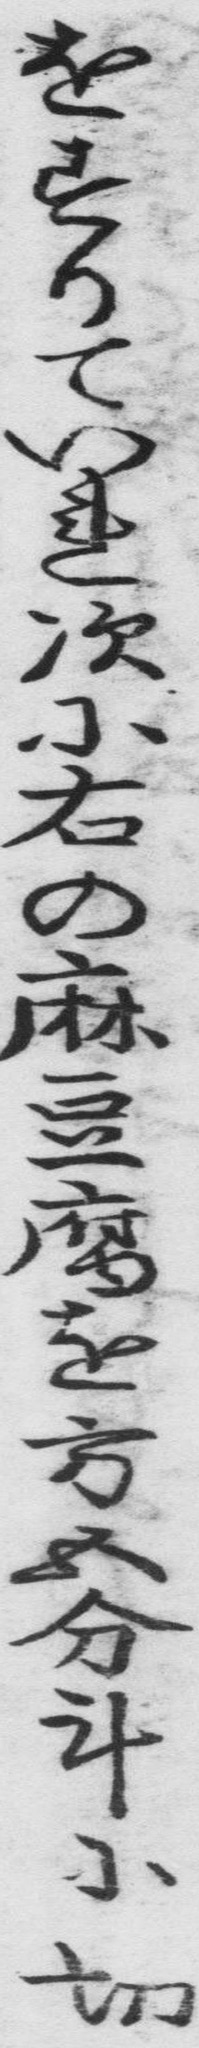を春りてい連次尓右の麻豆腐を方五分斗尓切
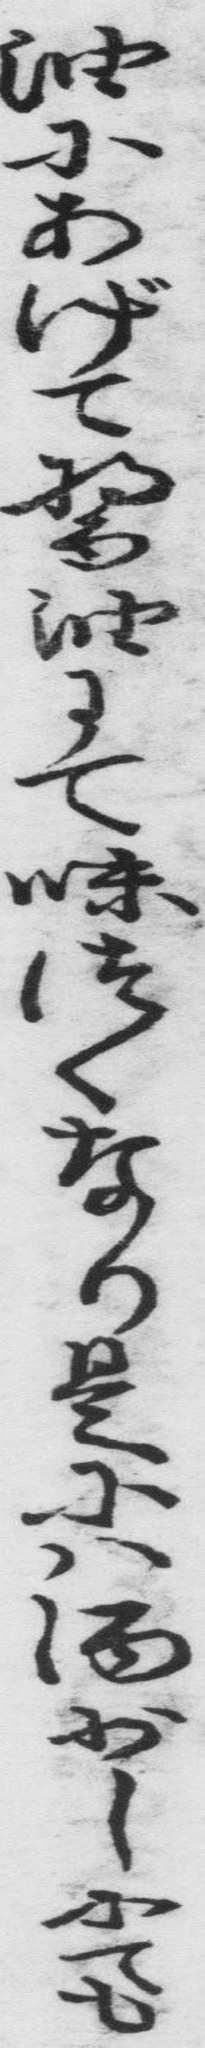油尓あげて醤油尓て味徒くなり是尓は酒少し尓ても
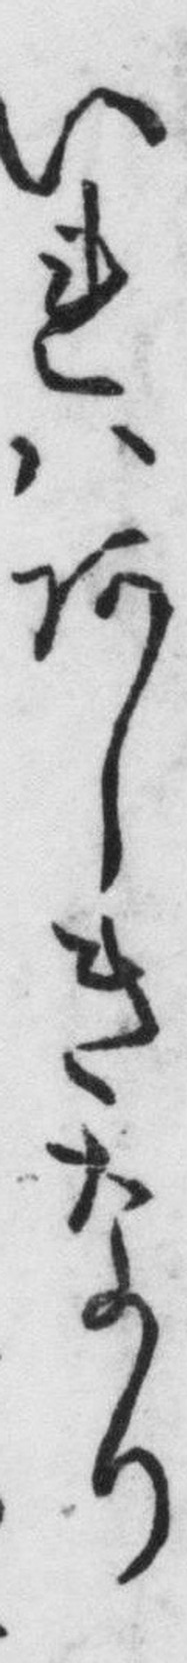い連は阿しきなり
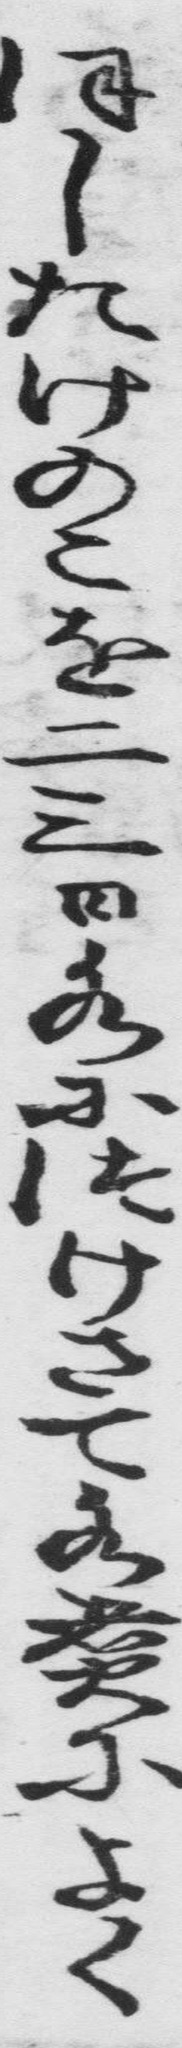ほしたけのこを二三日水尓徒けさて水煮煮よく
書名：普茶料理抄
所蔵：大阪府立大学学術情報センター 国文学研究資料館
